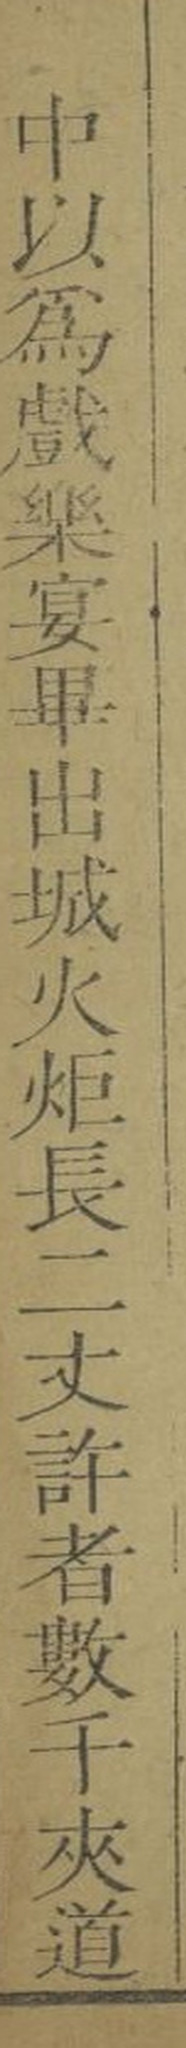中以爲戲樂宴畢出城火炬長二丈許者數千夾道

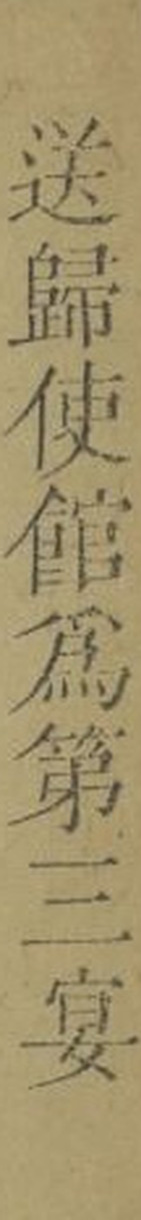送歸使館爲第三宴

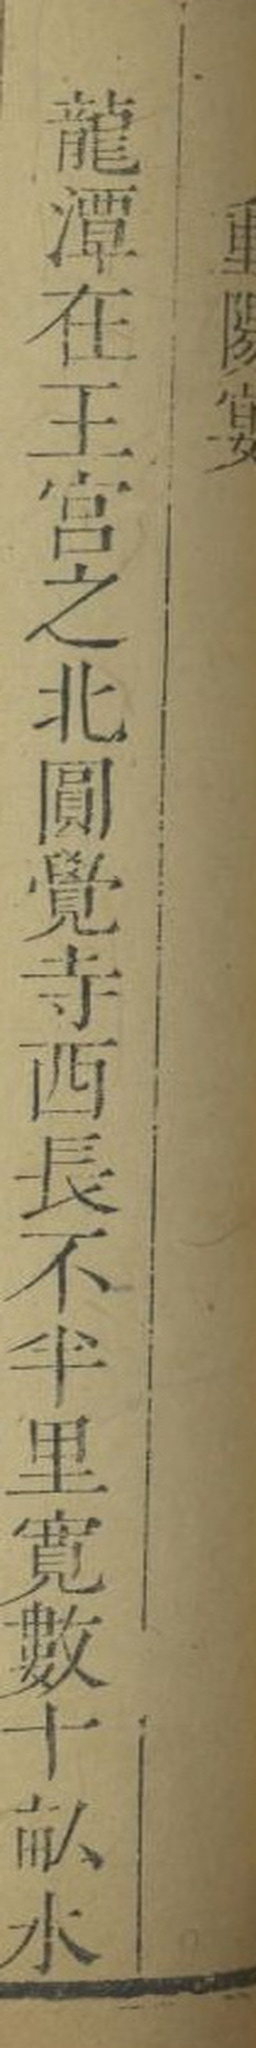龍潭在王宫之北圓覺寺西長不半里寛數十畒水
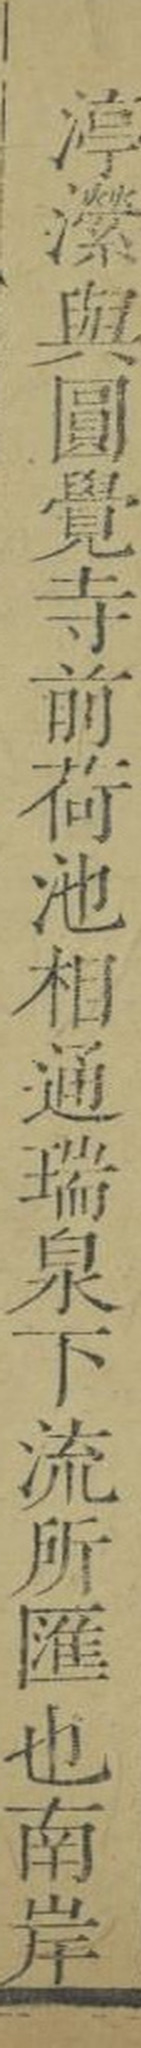渟瀠與圓覺寺前荷池相通瑞泉下流所匯也南岸
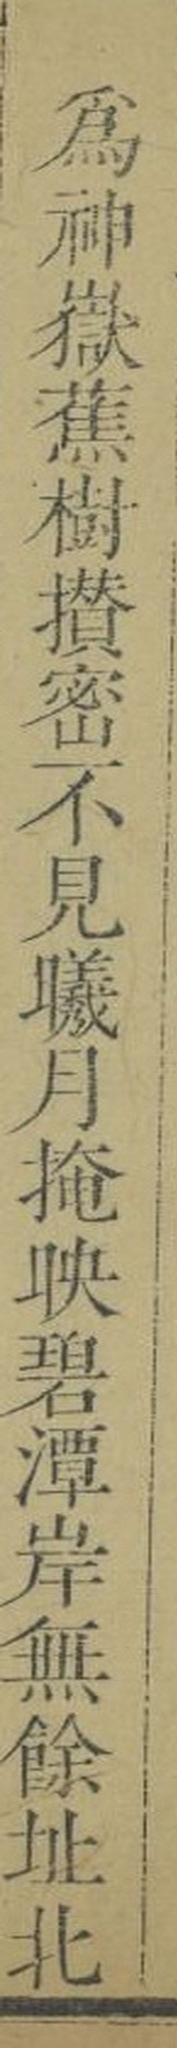爲神嶽蕉樹攅密不見曦月掩映碧潭岸無餘址北
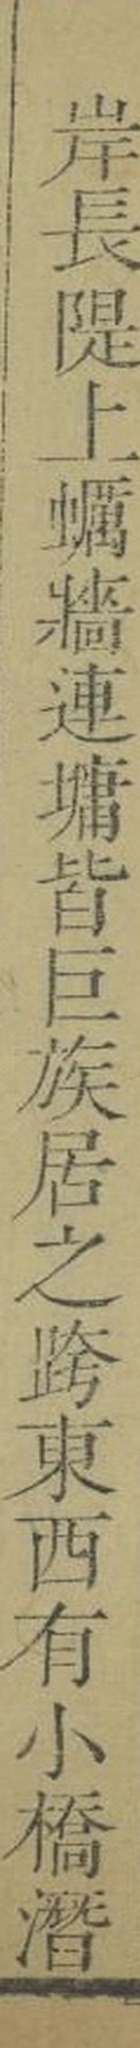岸長隄上蠣牆連墉皆巨族居之跨東西有小橋潛
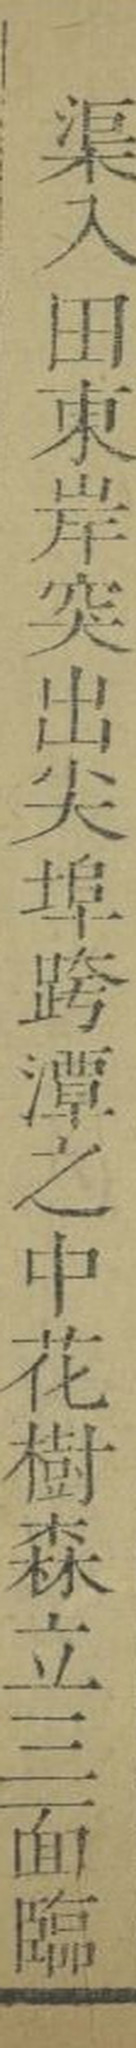渠入田東岸突出尖埠跨潭之中花樹森立三面臨
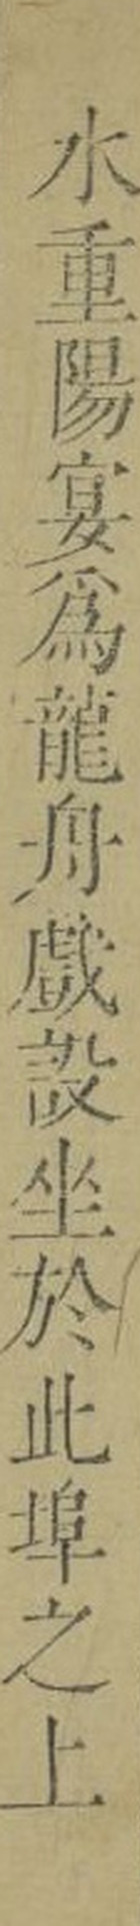水重陽宴爲龍舟戲設坐於此埠之上
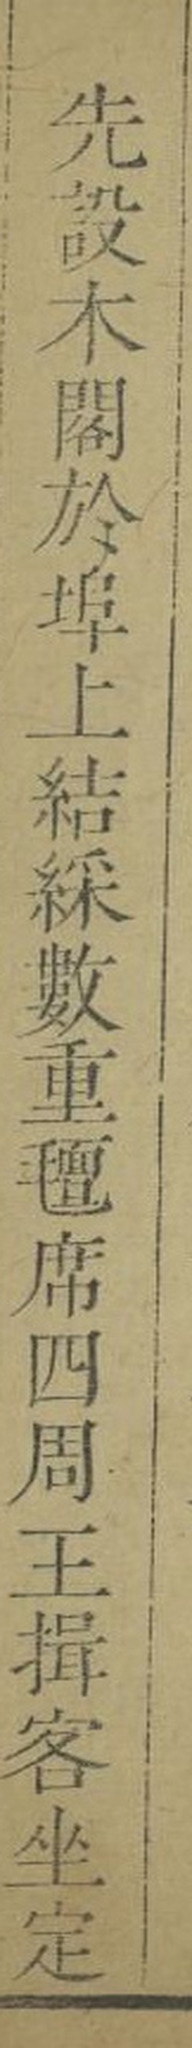先設木閣於埠上結綵數重氊席四周王揖客坐定
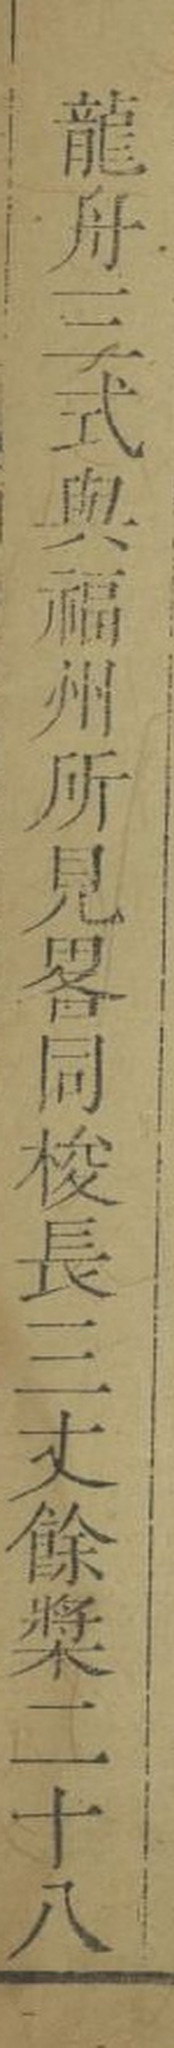龍舟三式與福州所見畧同梭長三丈餘槳二十八

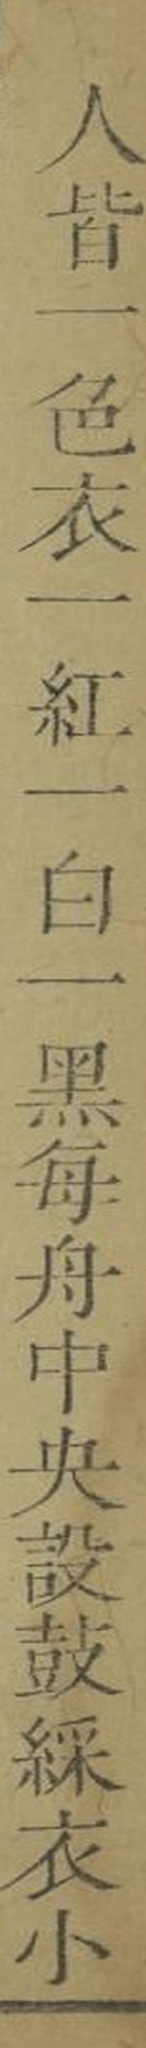人皆一色衣一紅一白一黑每舟中央設鼓綵衣小
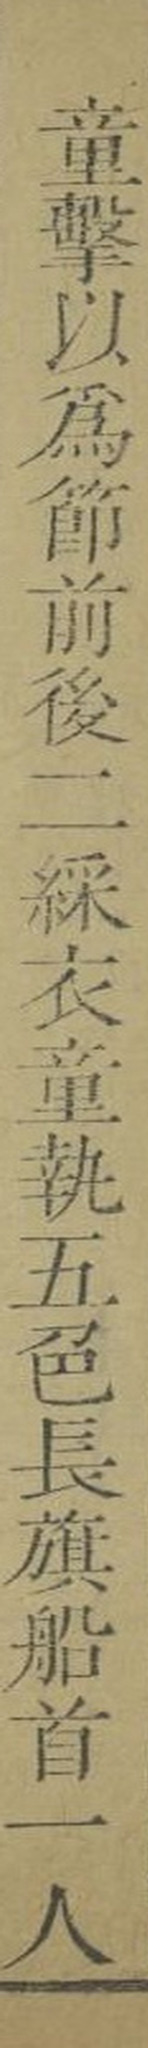童擊以爲節前後二綵衣童執五色長旗船首一人
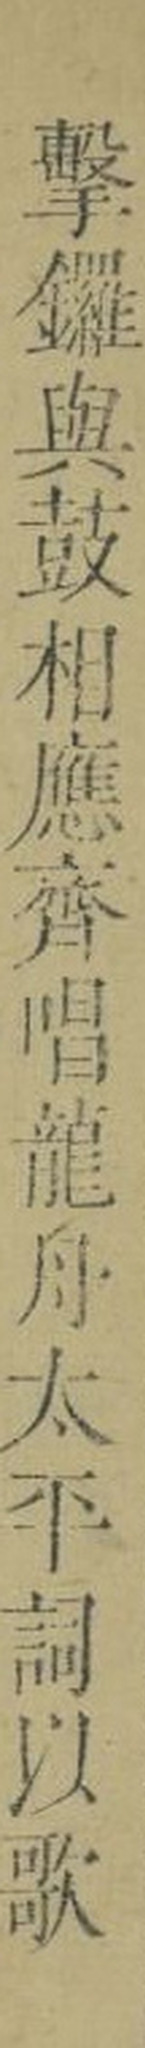擊鑼與鼓相應齊唱龍舟太平詞以歌
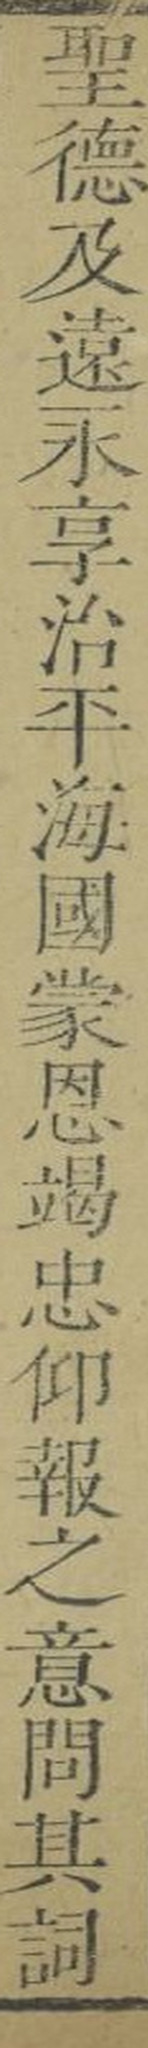聖德及遠永享治平海國蒙恩竭忠仰報之意問其詞
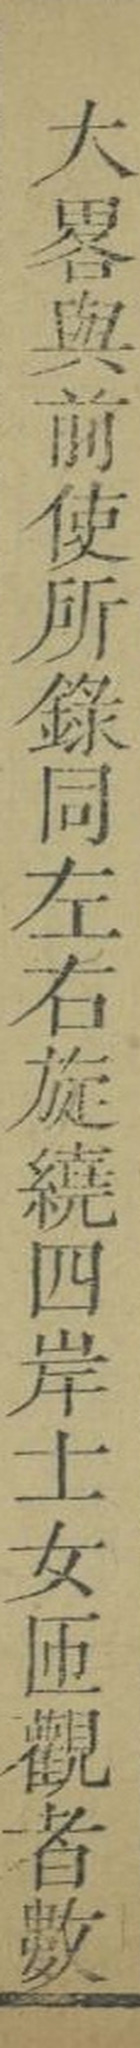大畧與前使所錄同左右旋繞四岸士女匝觀者數
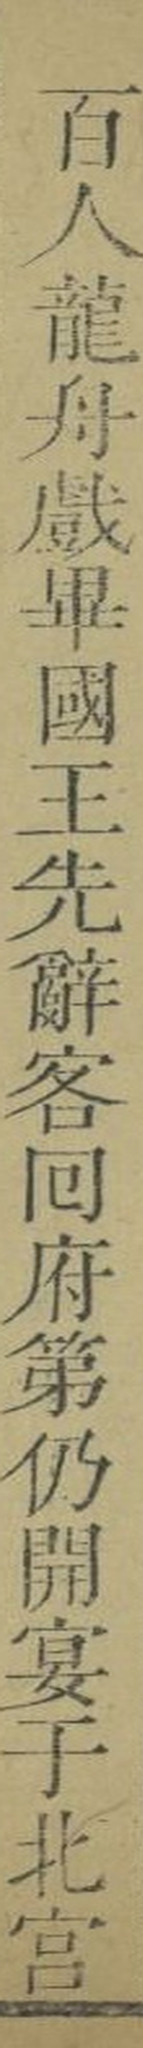百人龍舟戲畢國王先辭客囘府第仍開宴于北宫
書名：中山伝信録 巻二
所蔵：University of the Ryukyus Library
